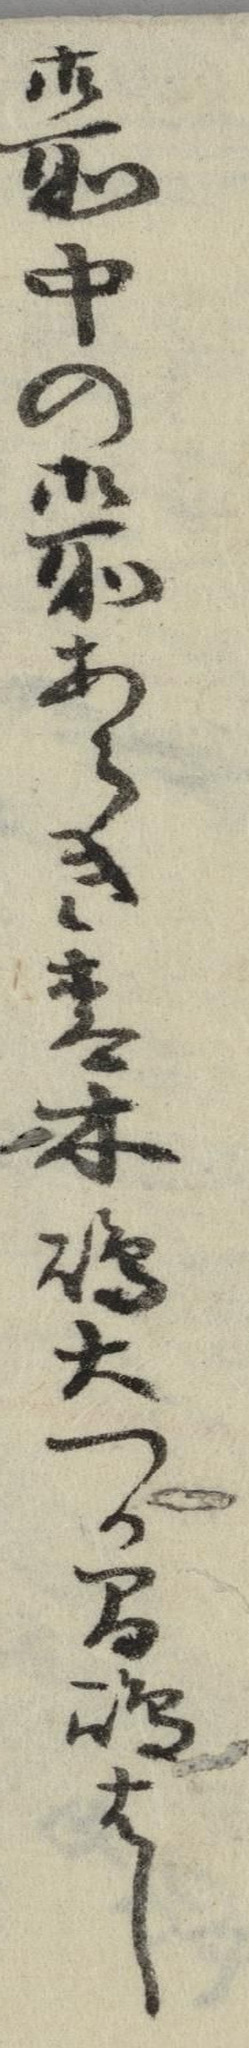御所中の御所あらき青木嶋大つか間嶋はし
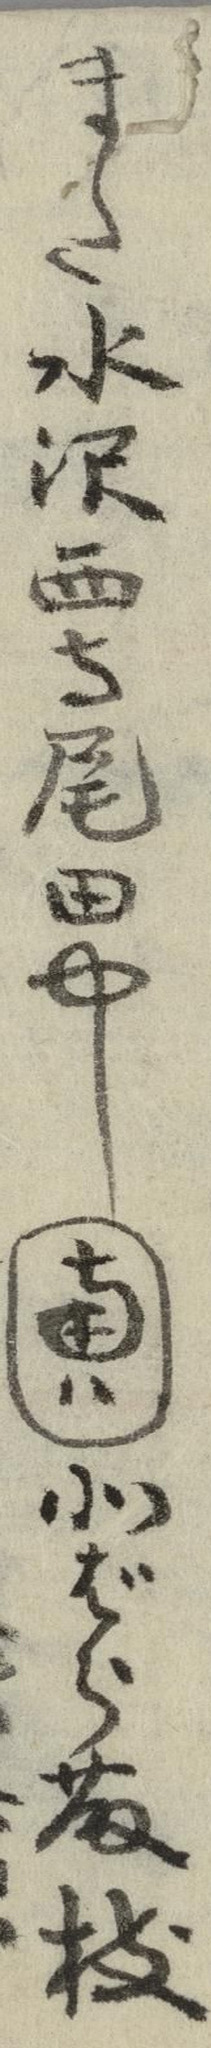また水沢西寺尾田中南ハ北ばら藤枝
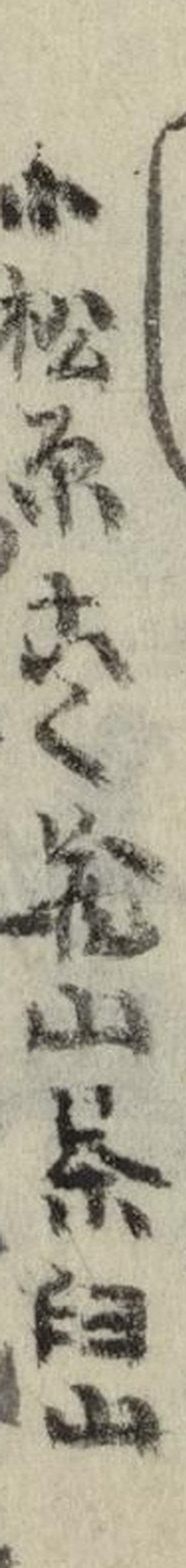小松原こく蔵山茶𦥑山
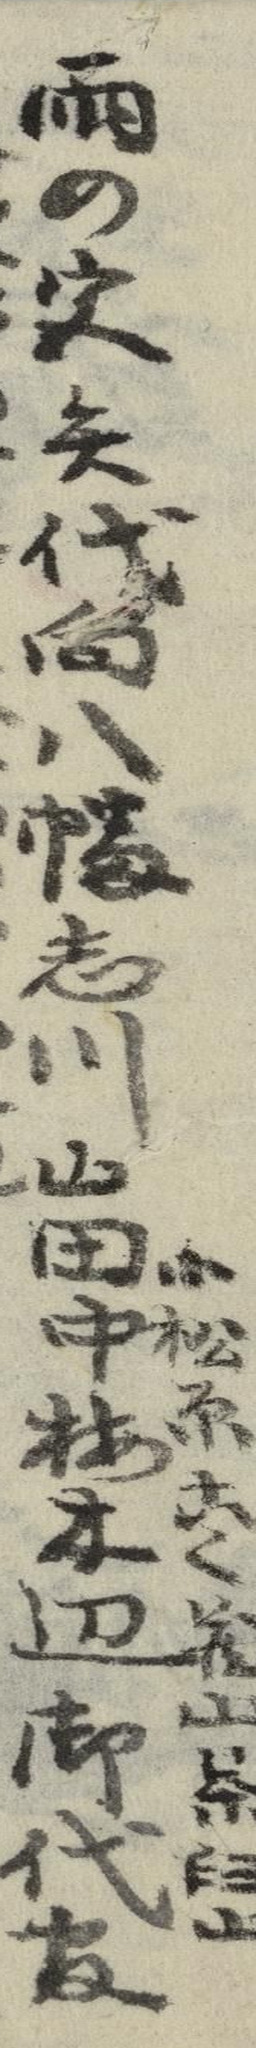雨の宮矢代向八幡志川山田中梅木辺御代官
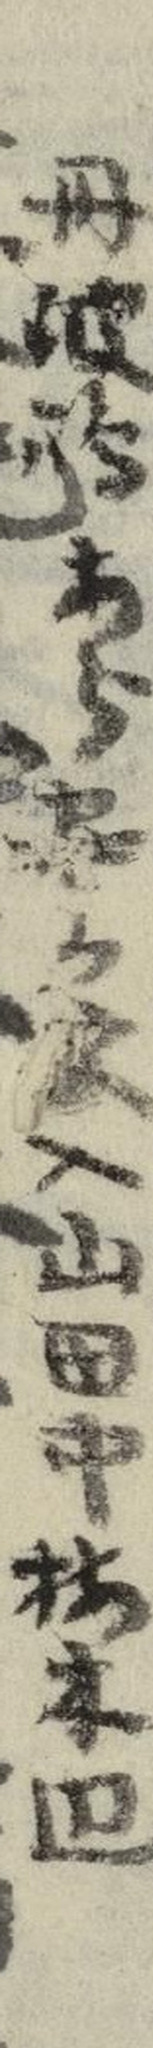丹波嶋あらケ宮入山田中梅木辺
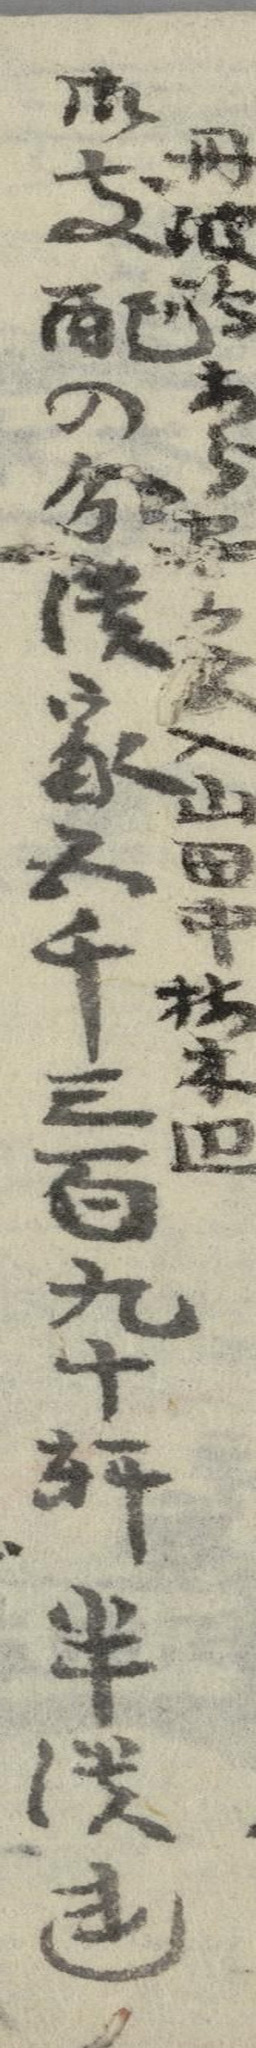御支配の分潰家五千三百九十軒半潰れ
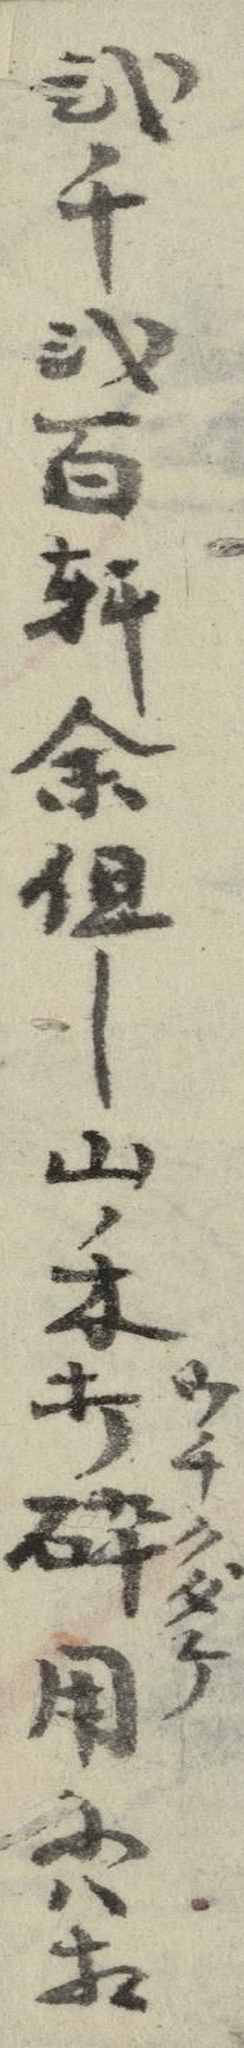弐千弐百軒余但し山ノ木打砕用にハ相

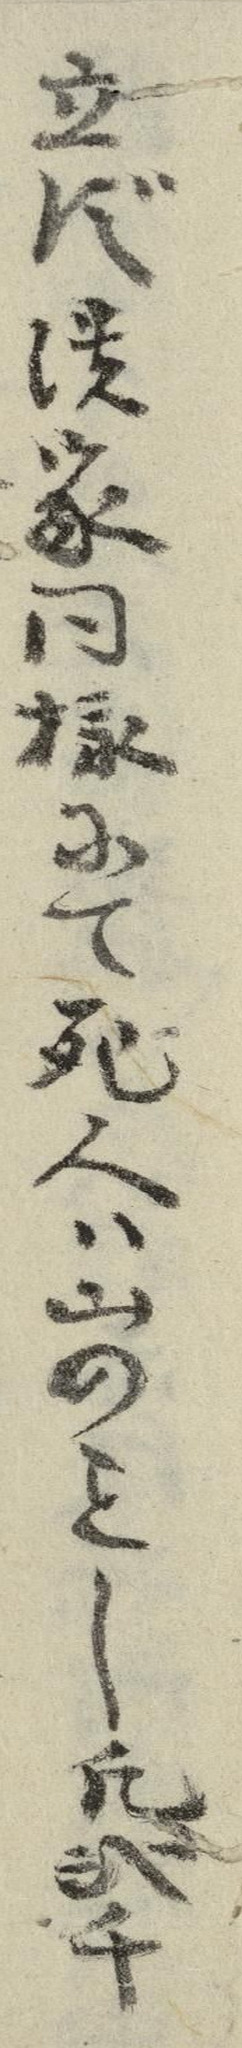立ず潰家同様にて死人ハ山のことし凡弐千
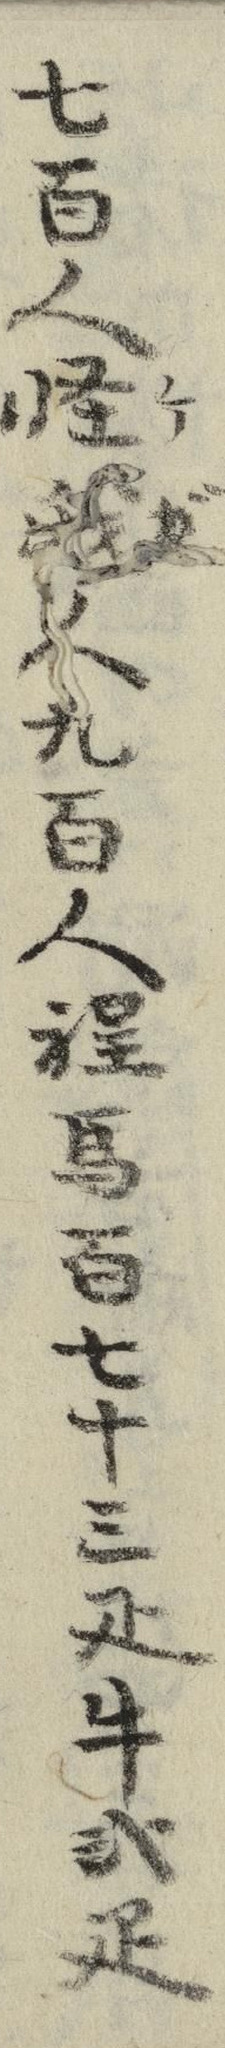七百人怪我人九百人程馬百七十三疋牛弐疋
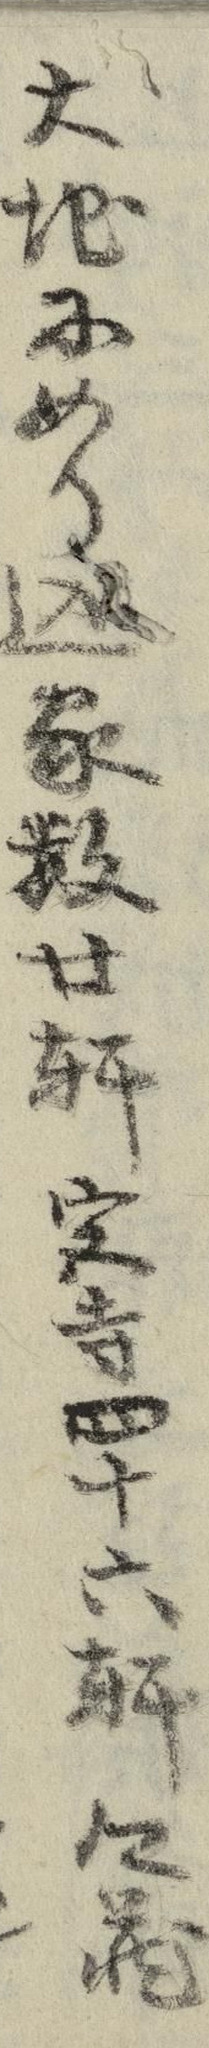大地にめり込家数廿軒宮寺四十六軒郷蔵
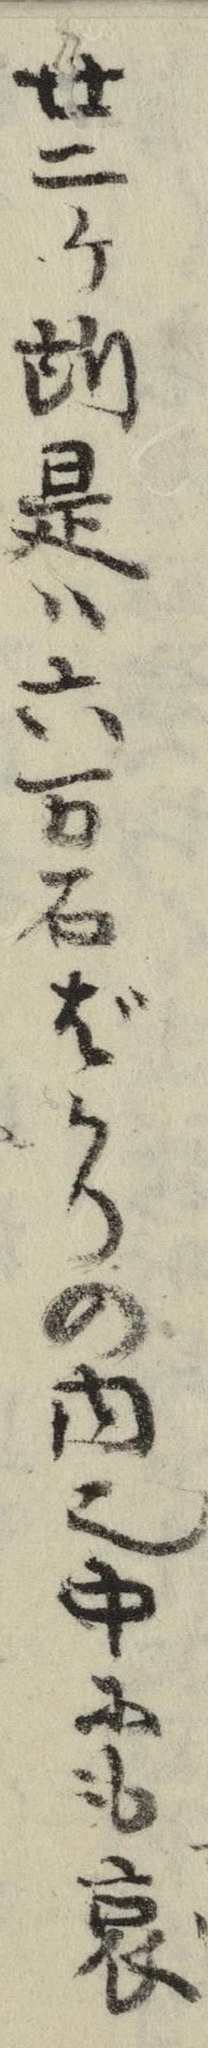廿二ヶ所是ハ六万石ばかりの内也中にも哀
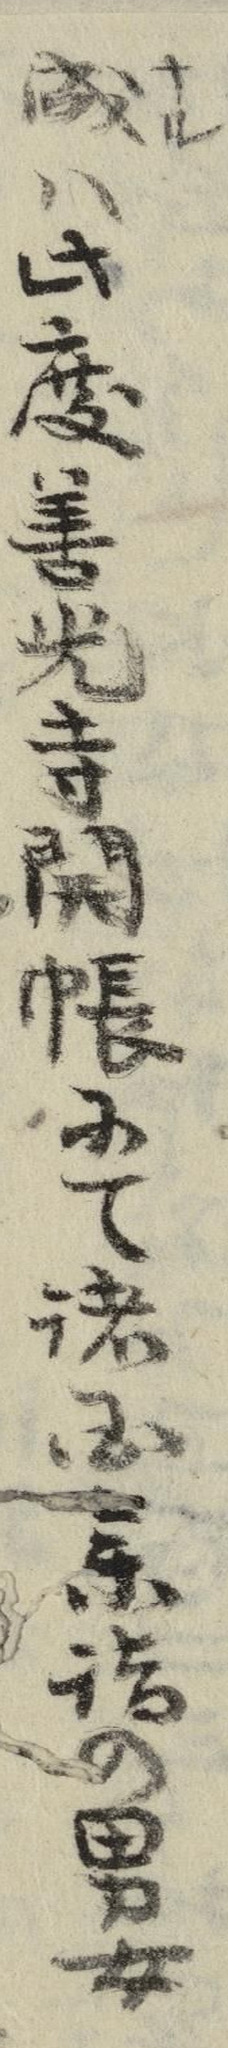成ハ此度善光寺開帳にて諸国参詣の男女
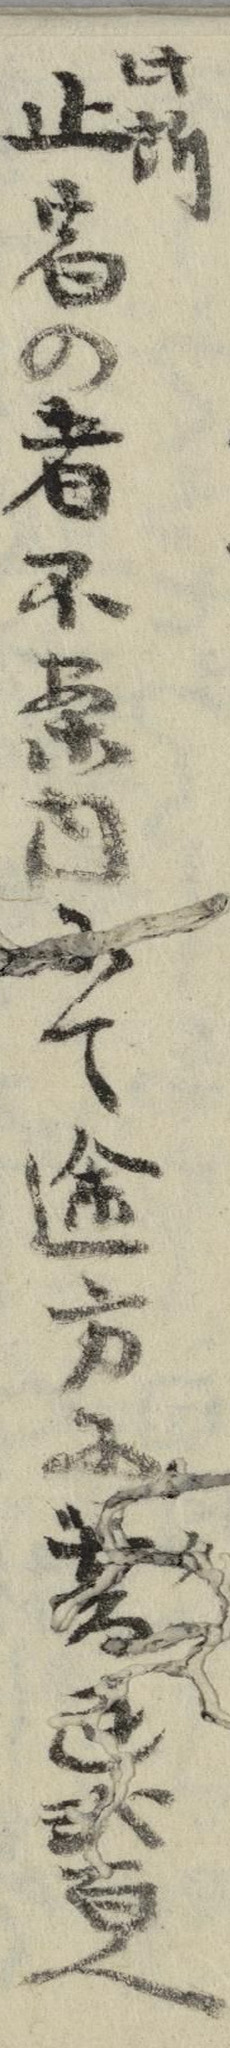此所止宿の者不案内にて途方に暮れ弐百人
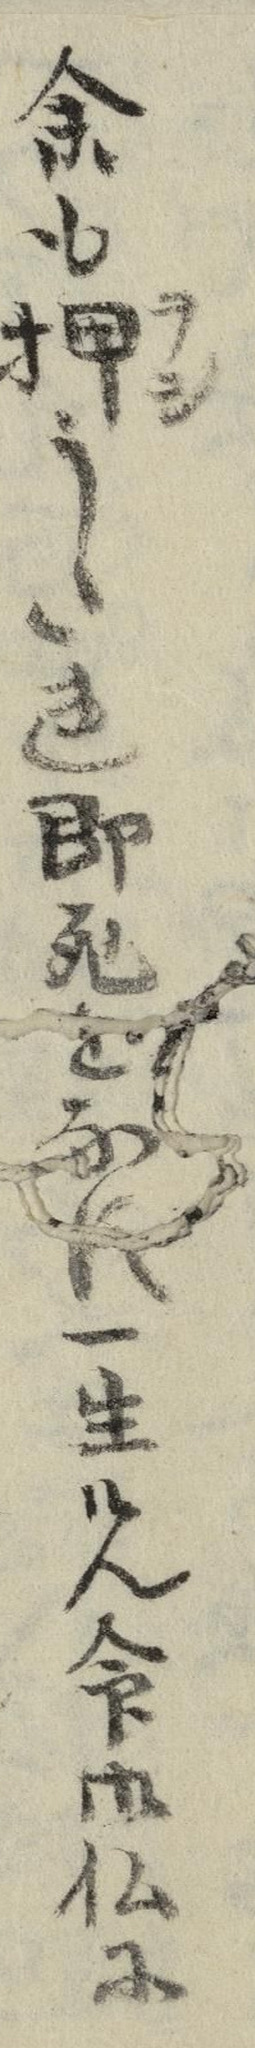余も押うたれ即死をなす一生けん命御仏に
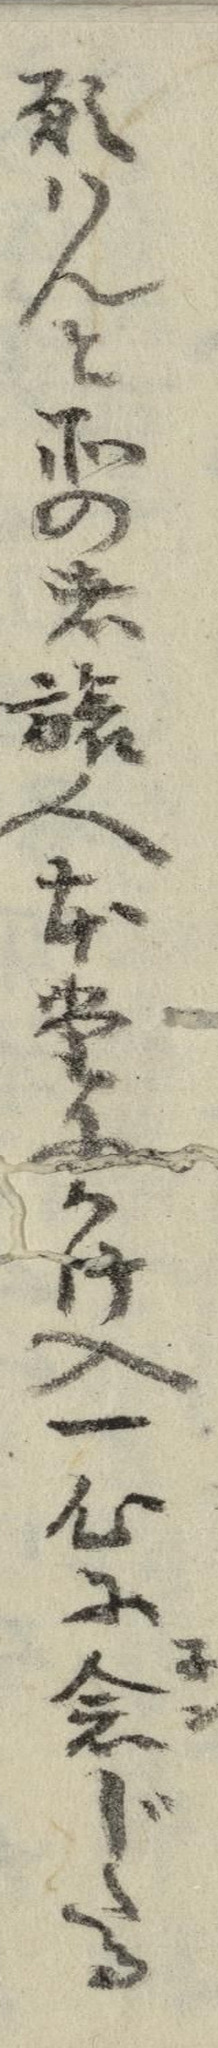願はんと所の者旅人本堂にかけ入一心に念じたる
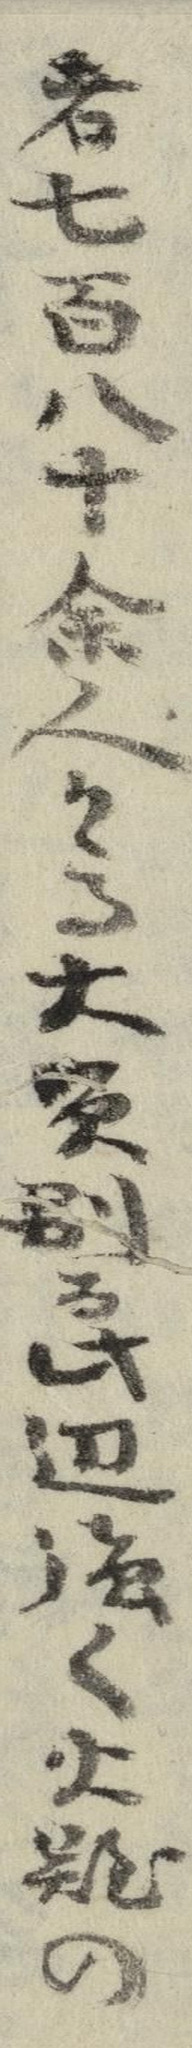者七百八十余人ける大災別而此辺強く火難の
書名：信州大地震一件之冩　丁未弘化四年三月吉日
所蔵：東京大学地震研究所図書室 Earthquake Research Institute Library, The University of Tokyo, JAPAN
